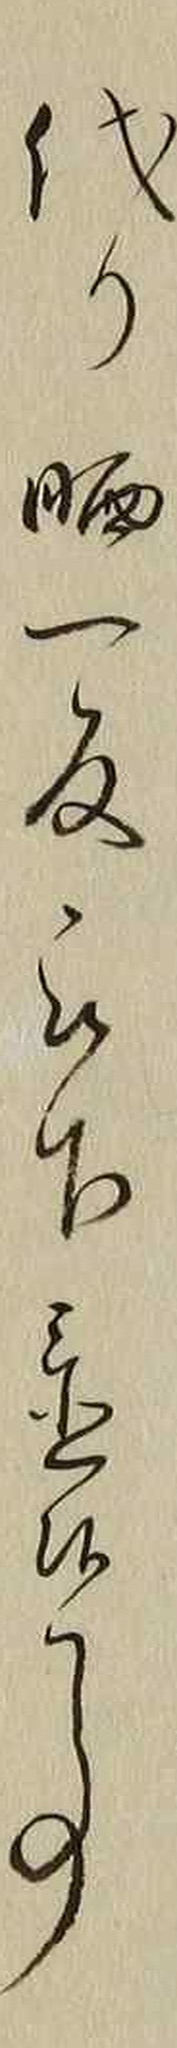代り晒一反被下置候事
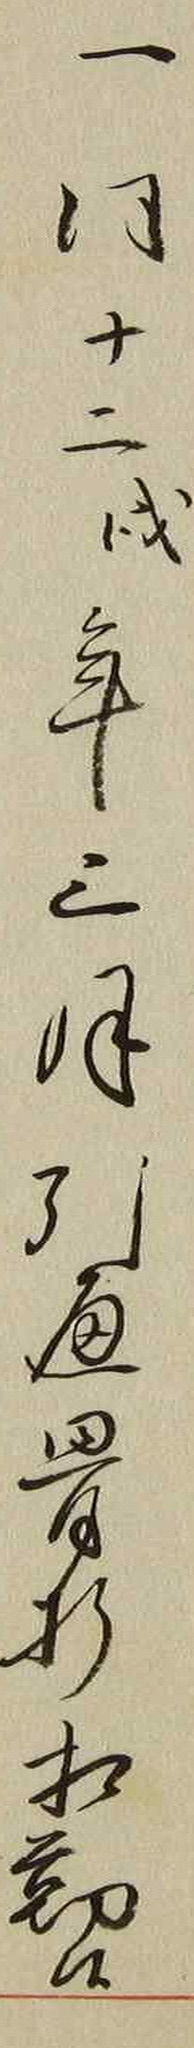一同十二戌年三月引通骨折相勤候
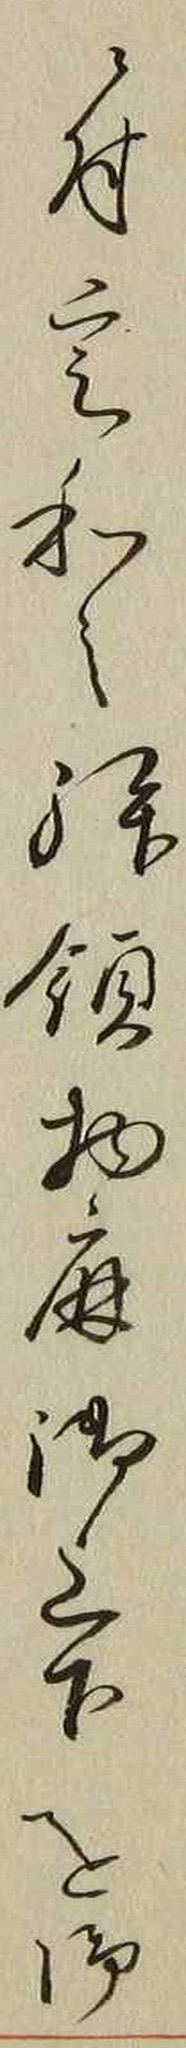に付定和之拝領物麻上下を御
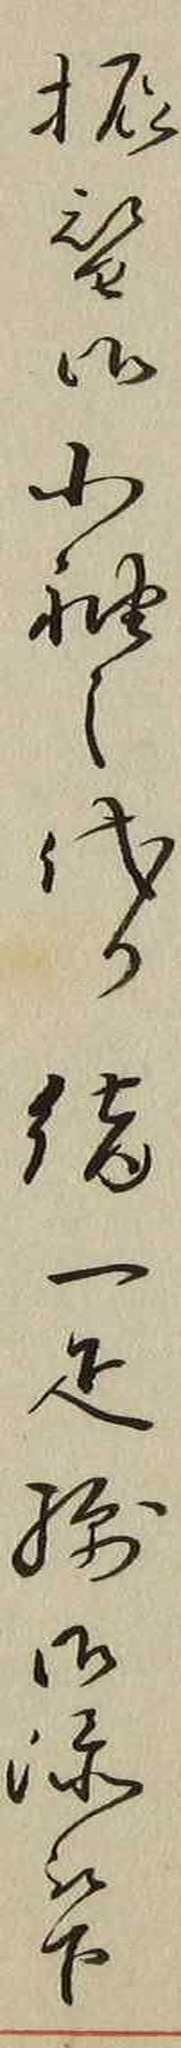振替御小袖之代り緒絹一疋綿御添被下
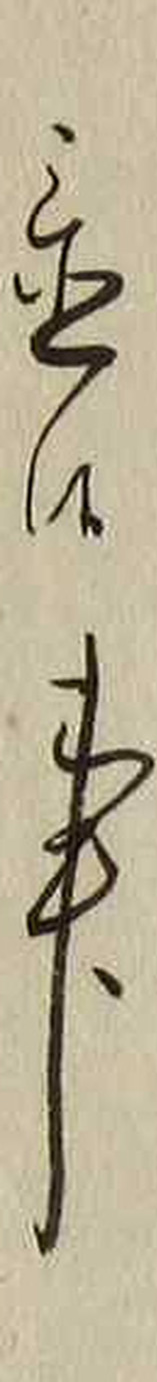置候事
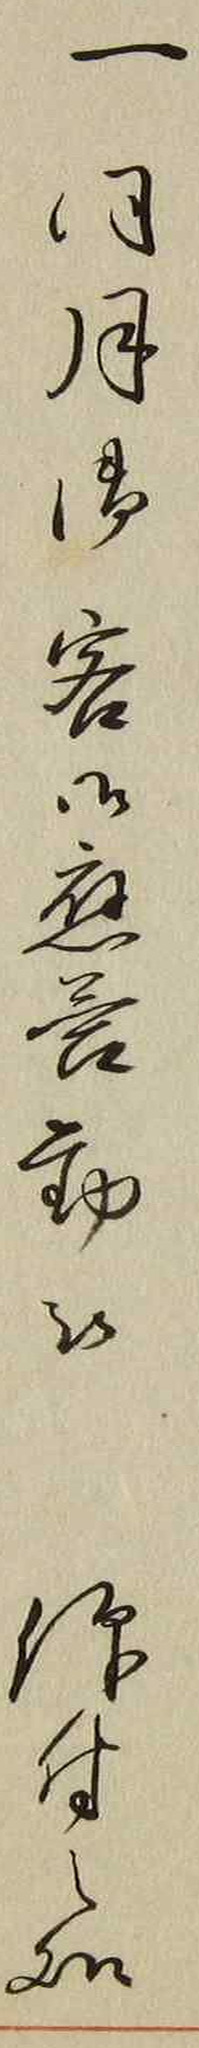一同月御客御応答勤被仰付之処
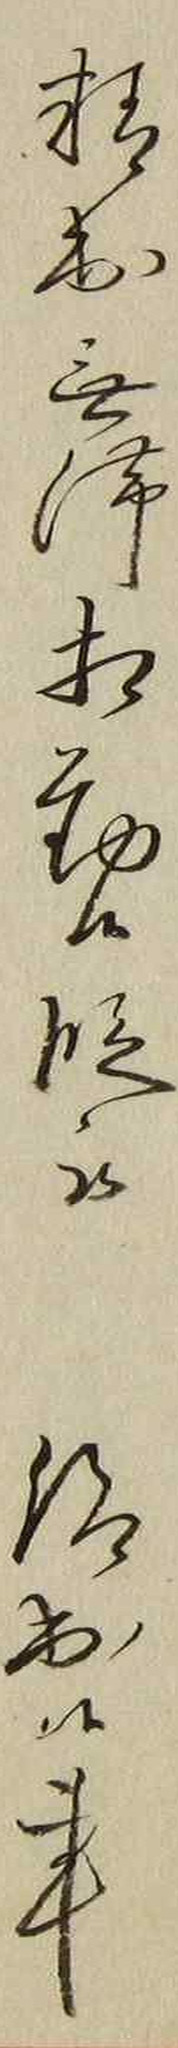精出無滞相勤候段被仰出候事
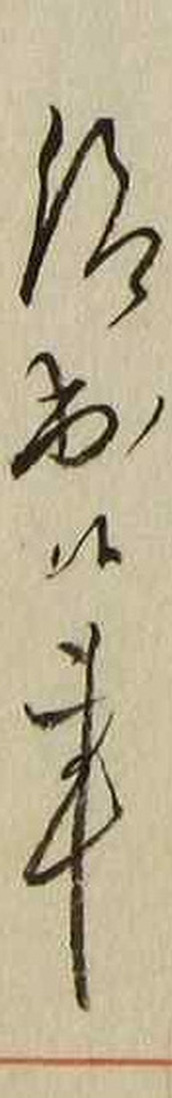仰付候事
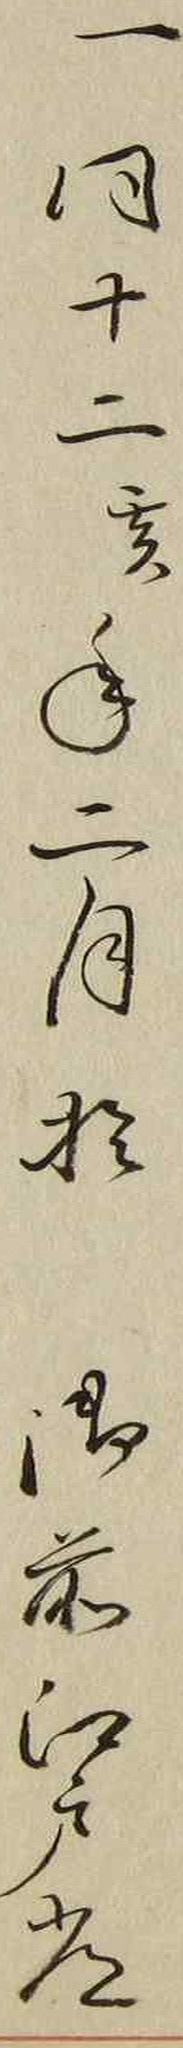一同十二亥年二月於御前江戸常
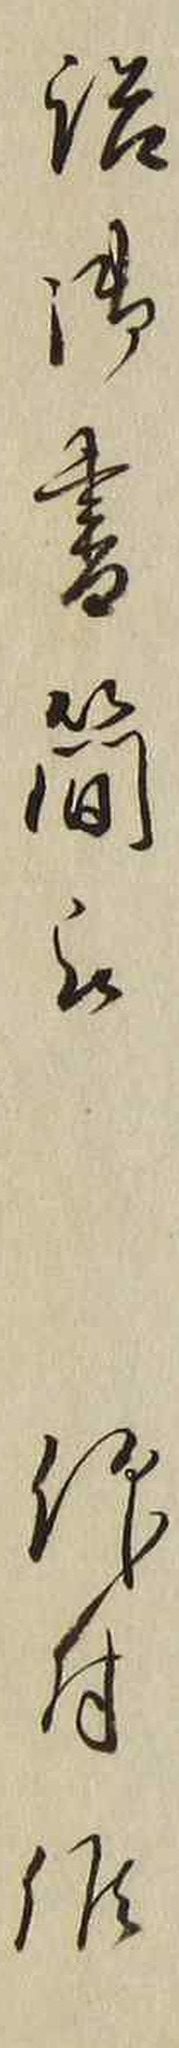詰御書簡被仰付候

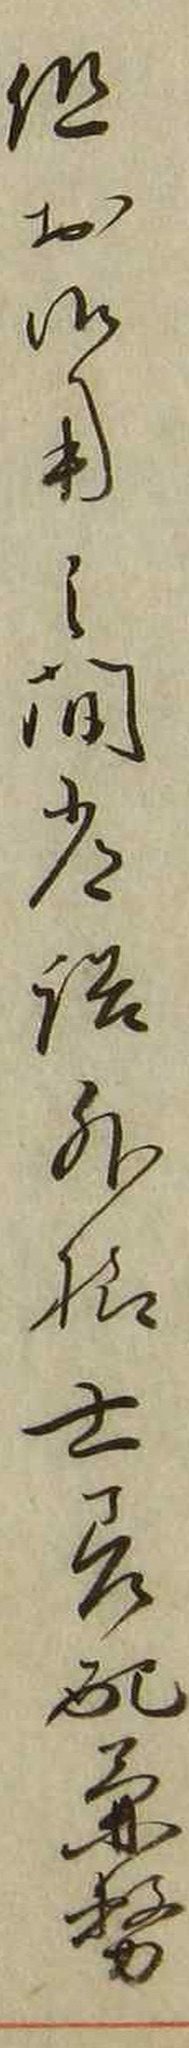但於御用之間常詰外様士差配兼務
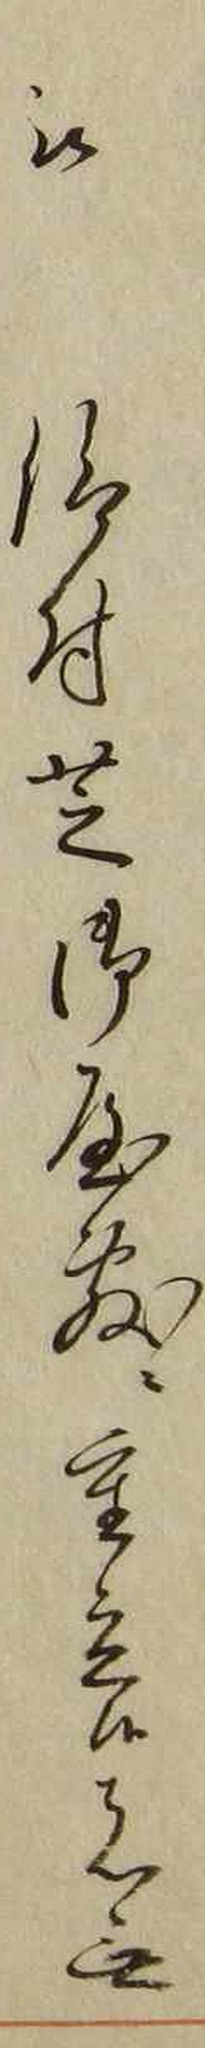被仰付芝御屋敷に立候者無
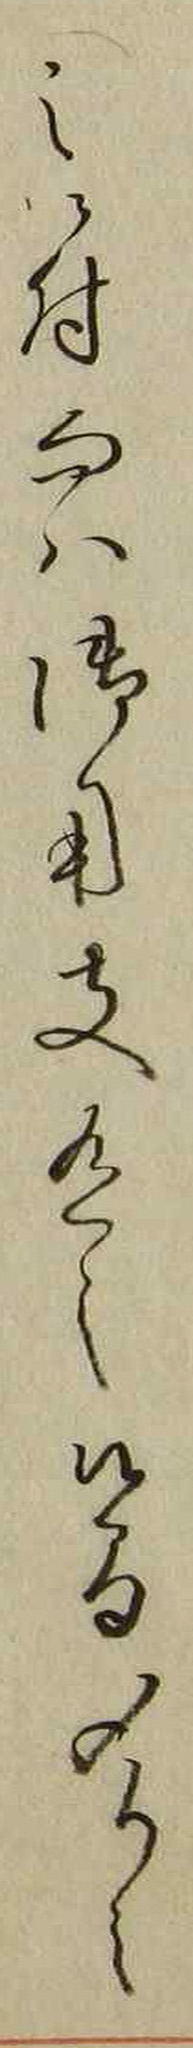之に付而は御用支有之候間之
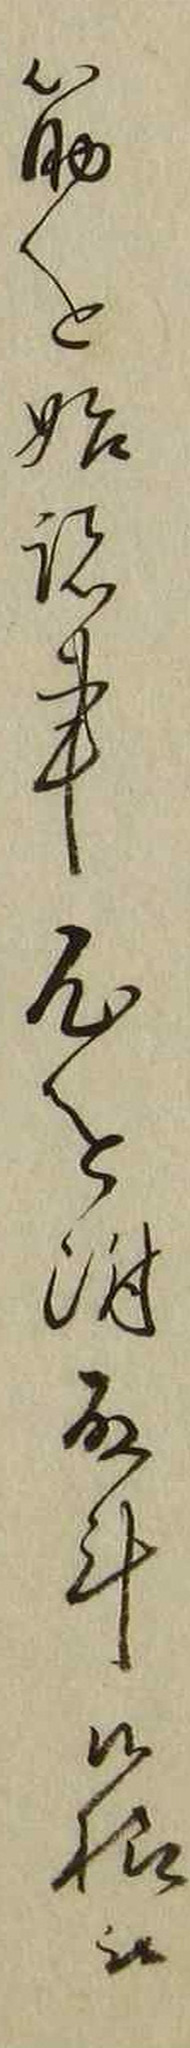筋を始諸事心を附取斗候様被
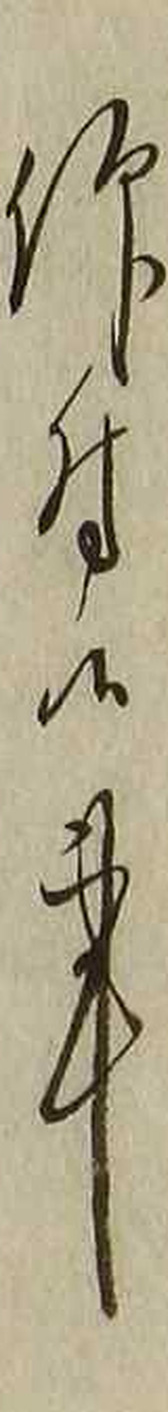仰付候事
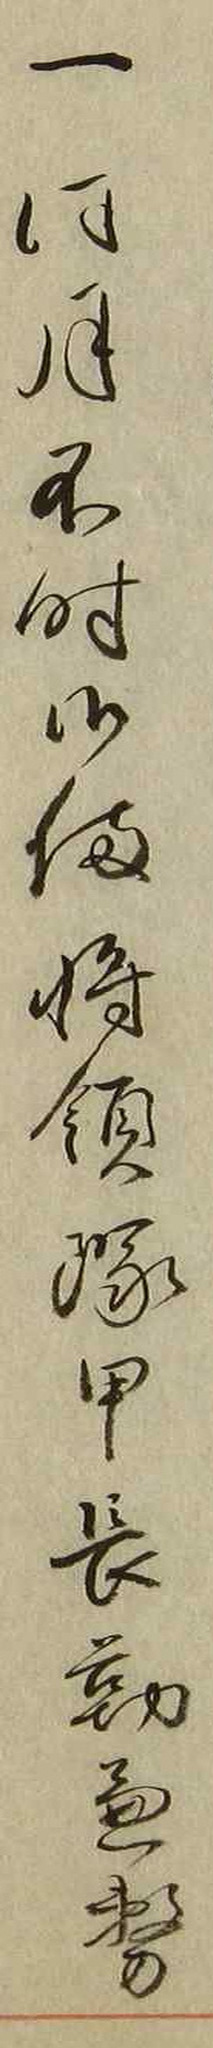一同月不時御備将領隊甲長勤兼務
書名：諸士系譜　巻之1　い之部1
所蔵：会津若松市立会津図書館
